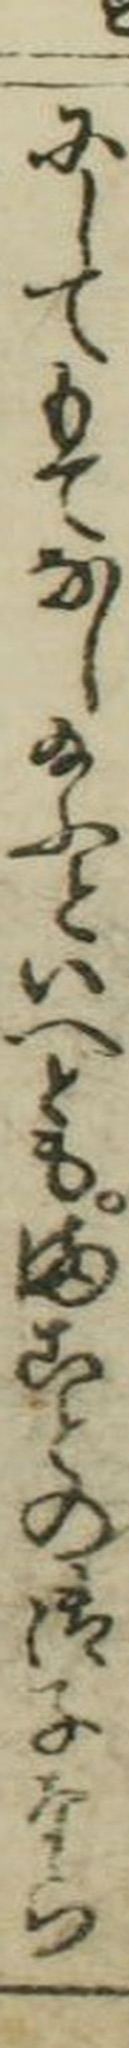にしてもてなし給ふといへとも。まことの御子なら
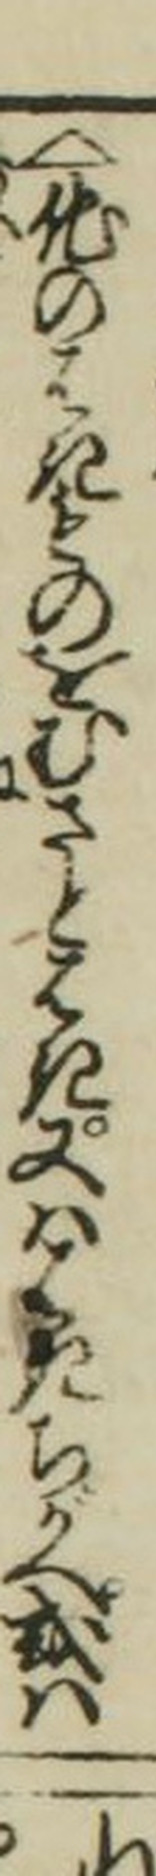△他のはきものをむさとはき。又ははきちがへ。或は
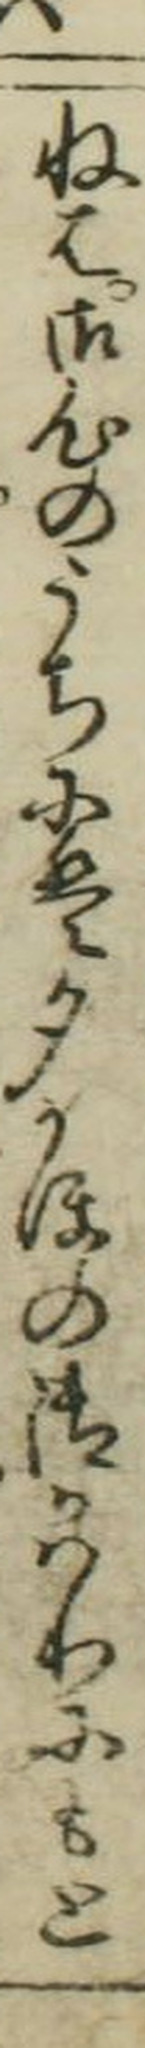ねは。御心のうちには夕かほの御かはりにもと
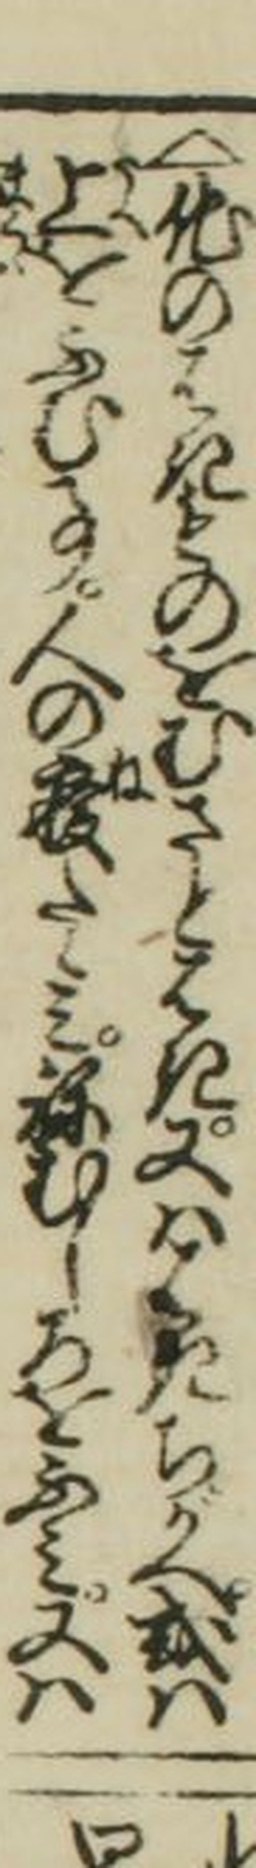上をふむ事。人の寝たゝみ。ねむしろをふみ。又は
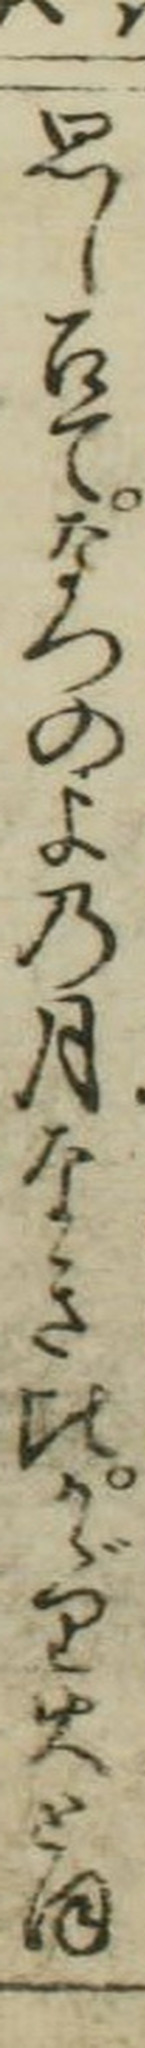思し召て。なつのよの月なき比。かゞり火とほ
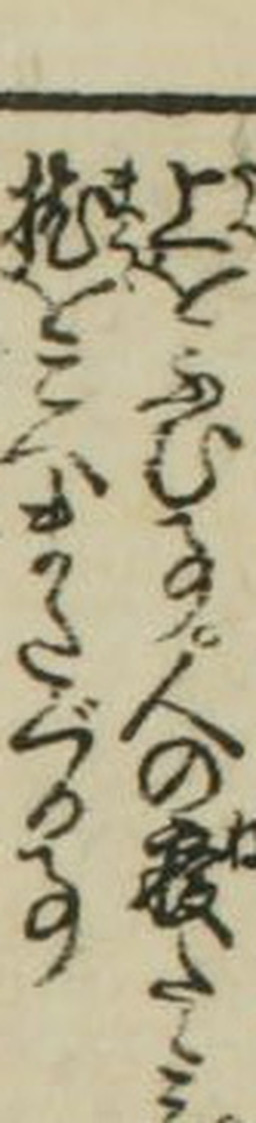枕をこへまたぐる事
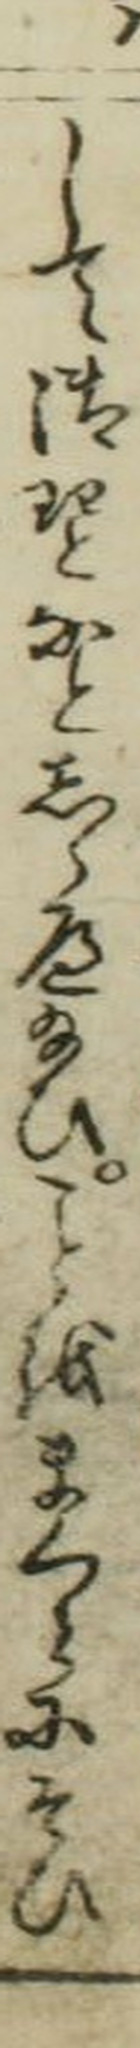して御琴なとしらへ給ひ。ことをまくらにそひ
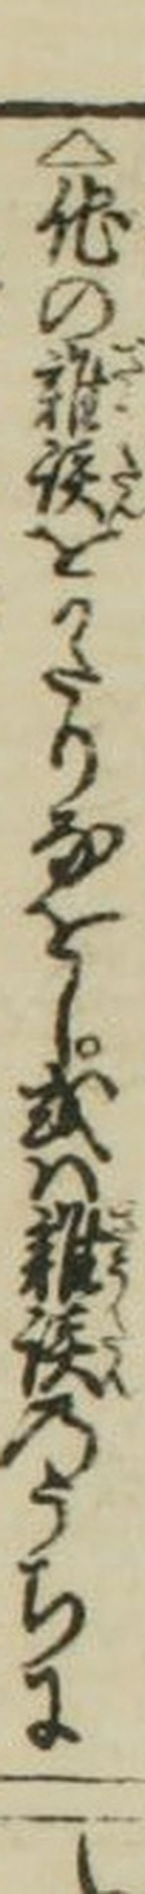△他の雑談をかたりなをし。或は雑談のうちに
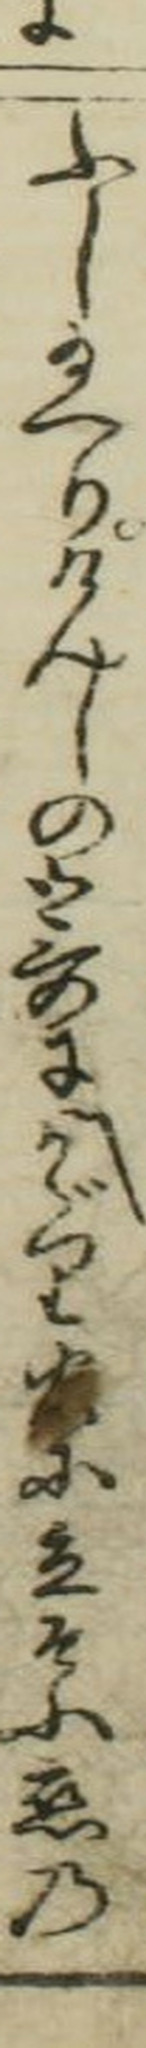ふし給へり。けんしの御哥に〽かゞり火に立そふ恋の
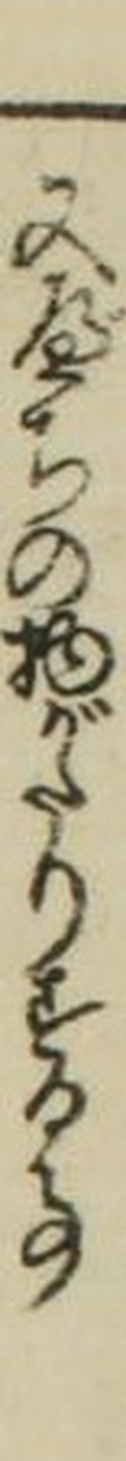又べちの物がたりする事
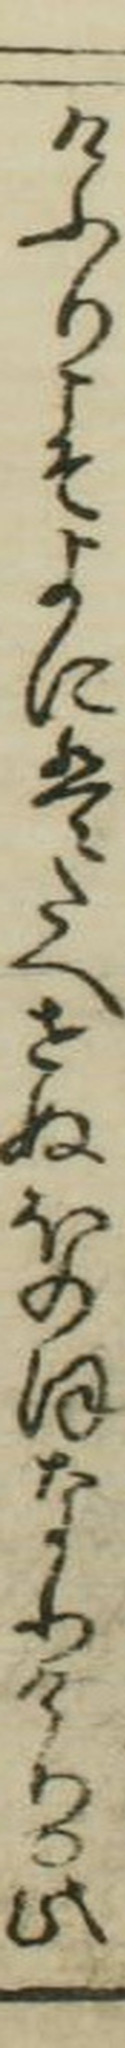けふりこそよにはたへせぬほのほなりけり○此
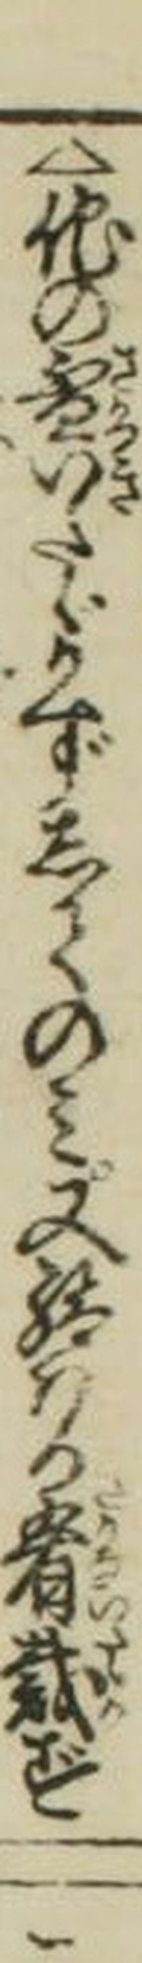△他の盃いたゞかずしてのみ。又終はる肴字戴ず
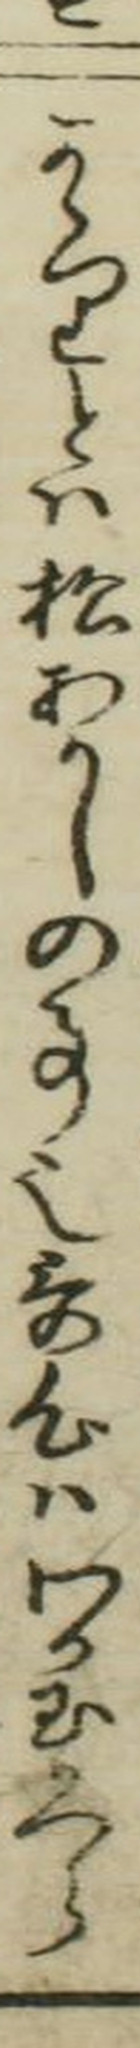かゝりとは松あかしの事也哥心はわか玉かつら
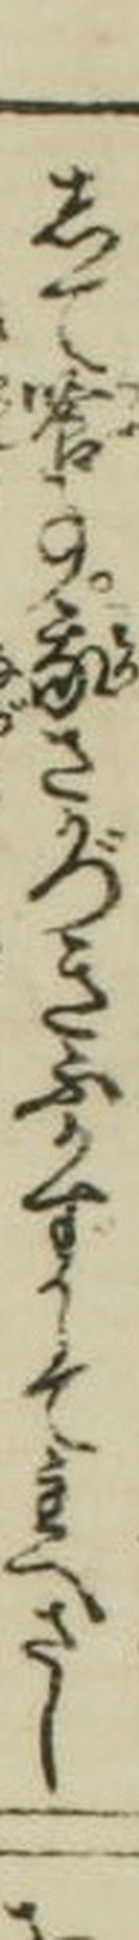して喰事。我さかづきふかずして主へさし
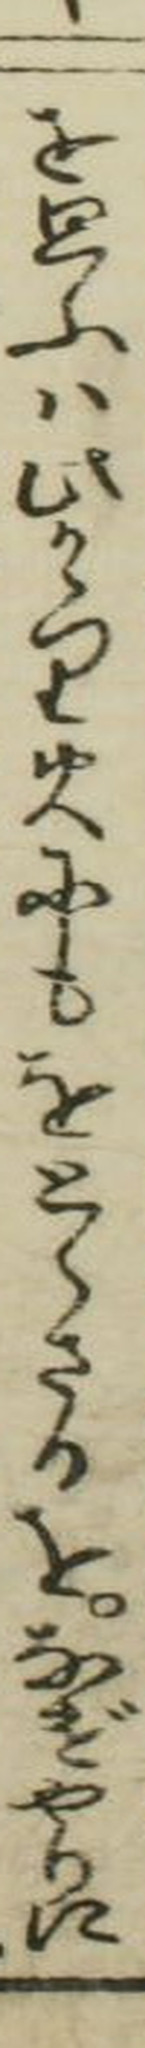を思ふは此かゝり火にもをとらさるを。なげやりに
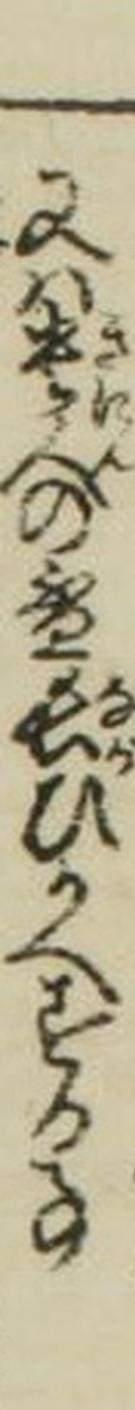又は貴人の盃長ひかへする事
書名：女源氏教訓鑑
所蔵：東京学芸大学附属図書館
